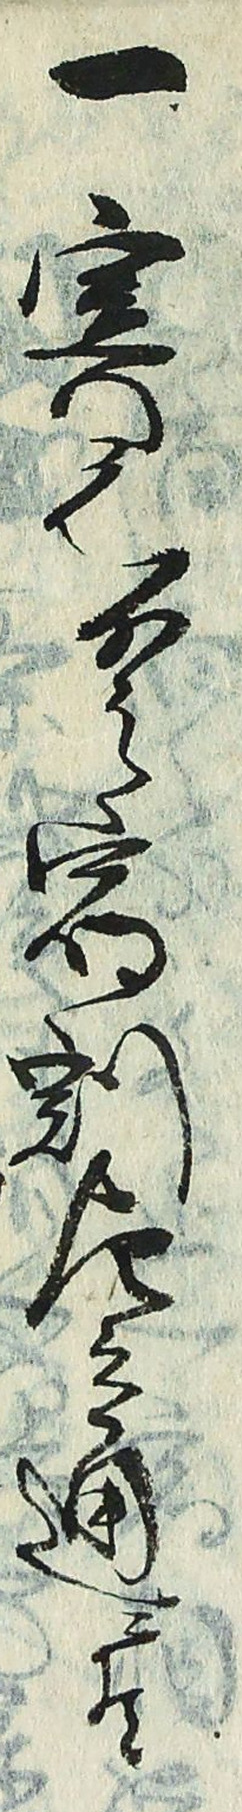一割元ゟ之宿割左之通に候
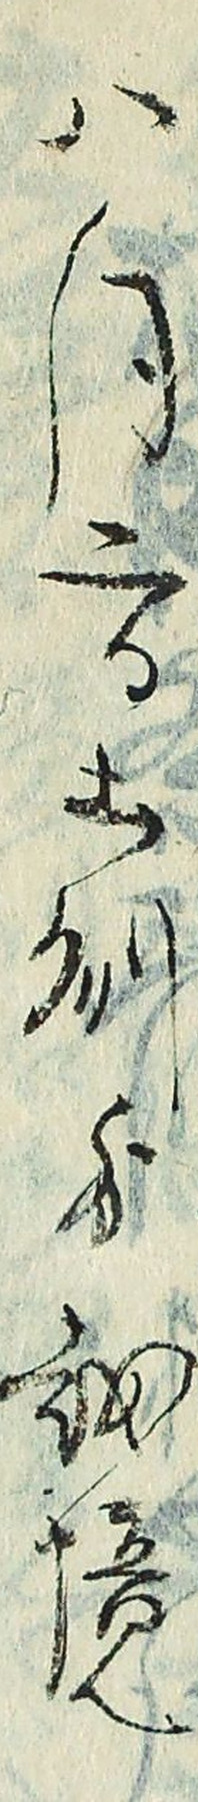八月二日土州ゟ越境
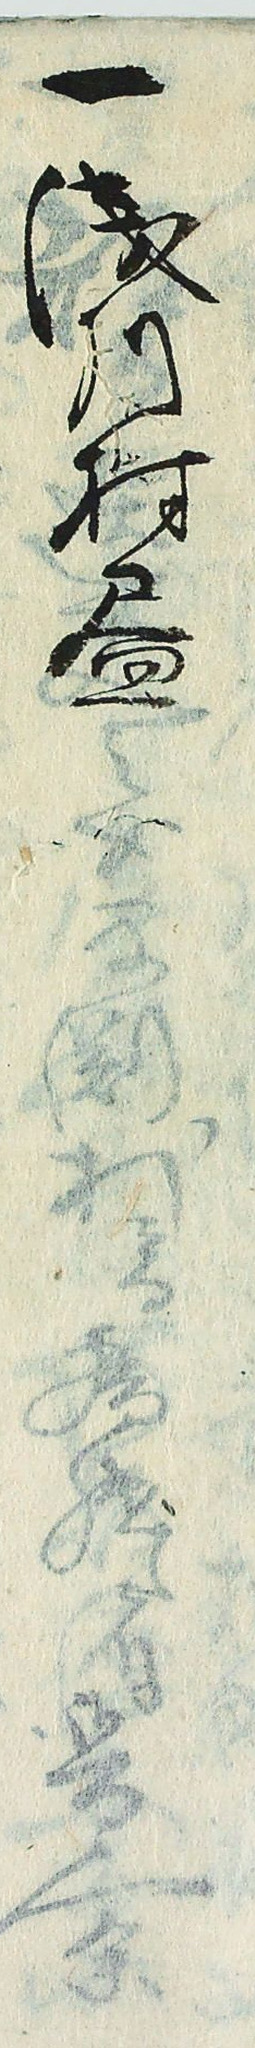一浅川村昼
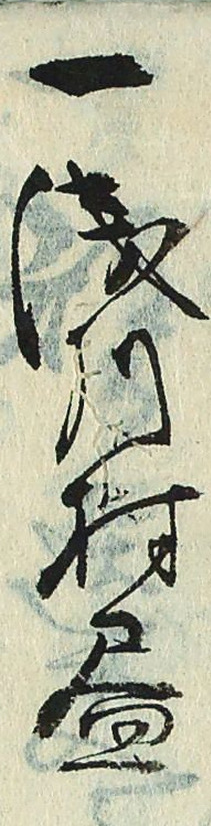一浅川村昼
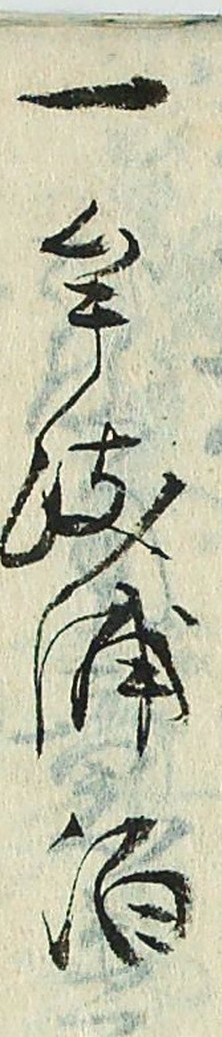一牟岐浦泊
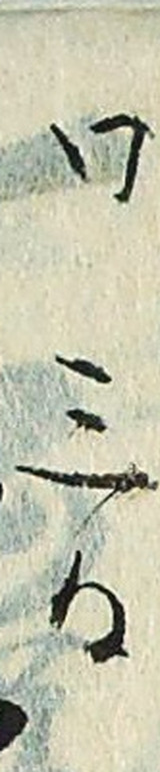同三日
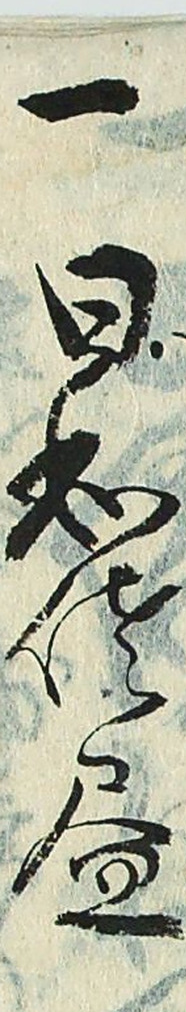一日和佐昼
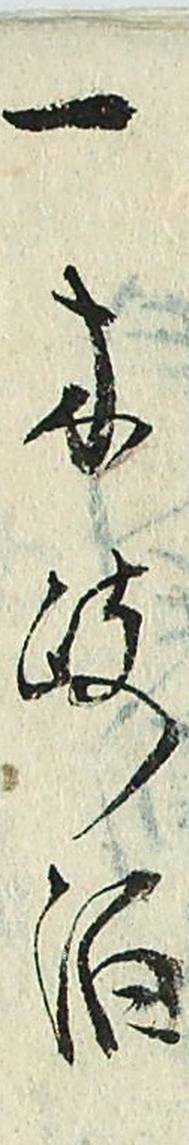一木岐泊
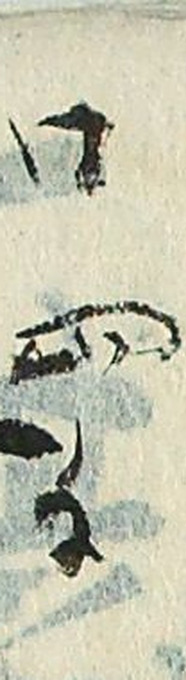同四日

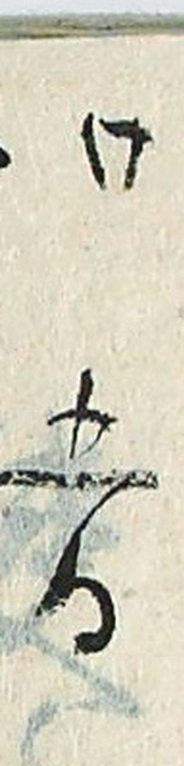同五日
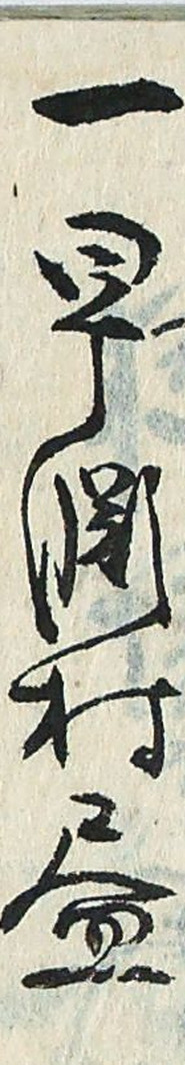一早淵村昼
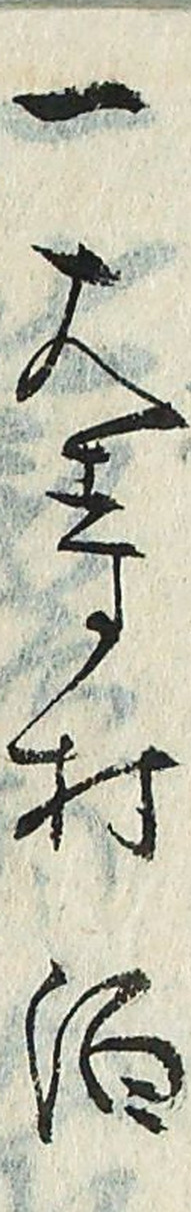一大寺村泊
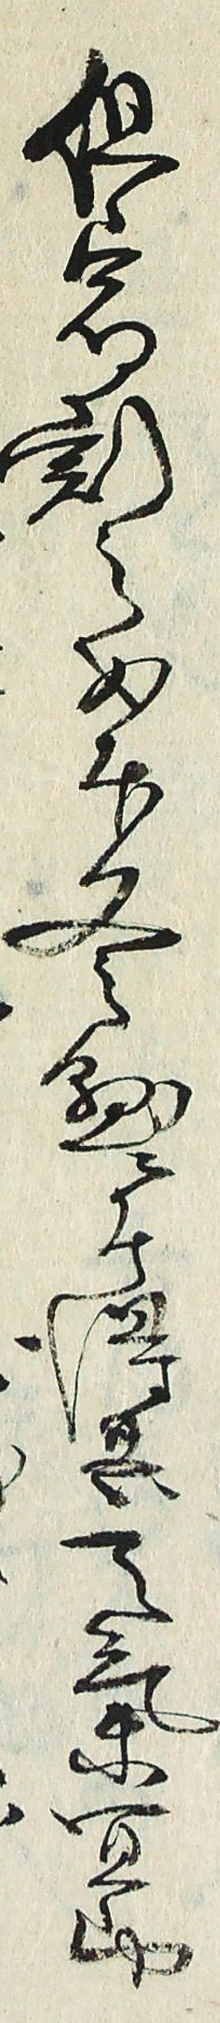但宿割之義本文之懸に候得共天気宜布
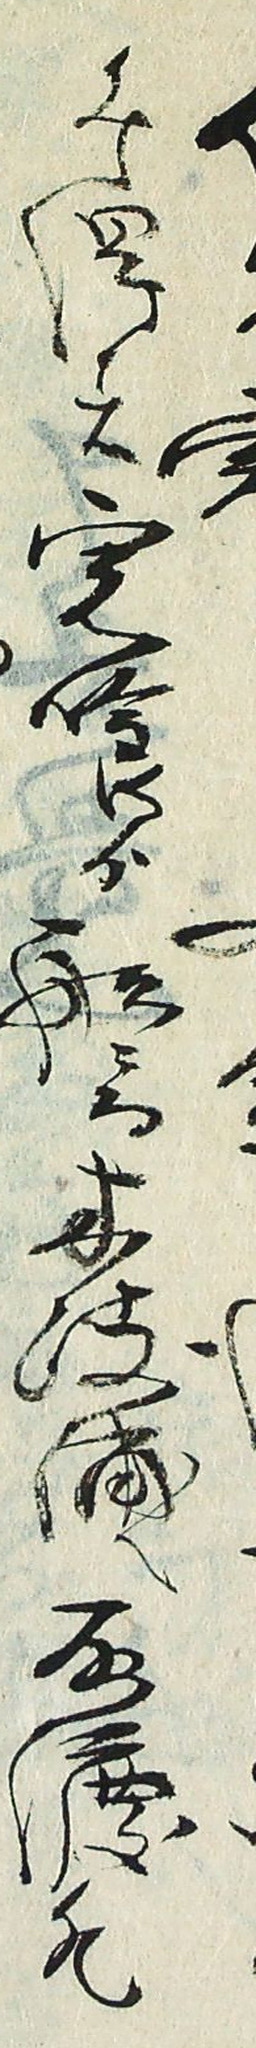候得は宍喰ゟ船にて木岐浦へ取渡候
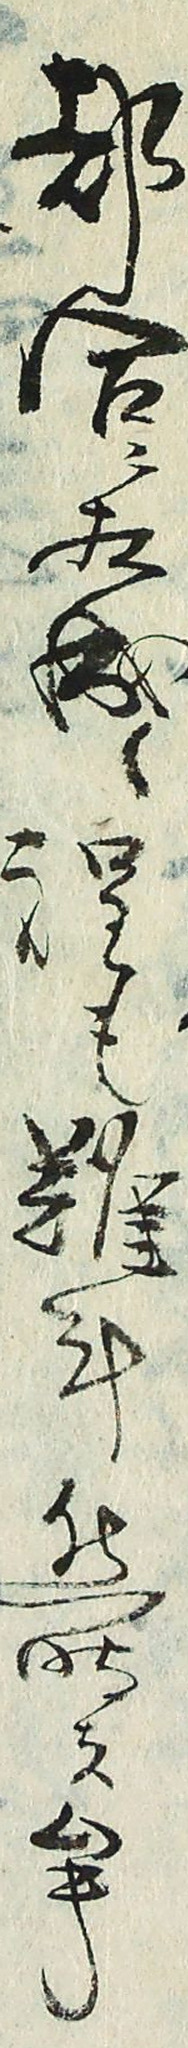都合に相成候程も難計然時は牟
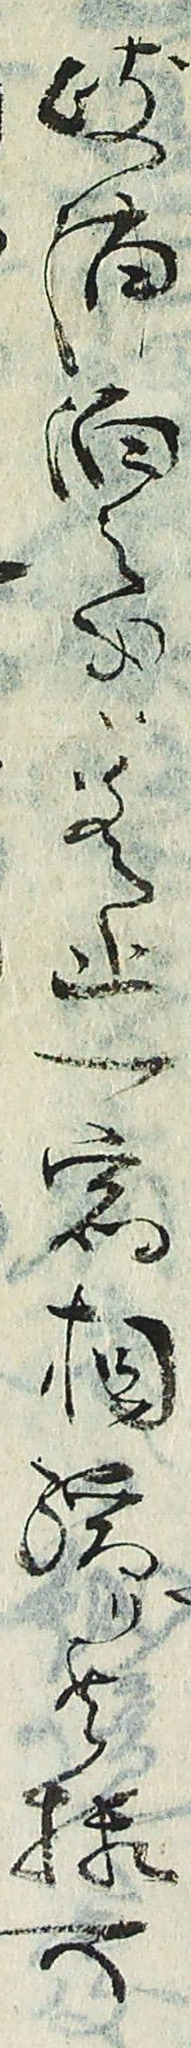岐浦泊之義は差止一宿相縮り候様可
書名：公辺御役人為御廻浦御立越諸御用一巻
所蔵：鳴門教育大学 Naruto University of Education
